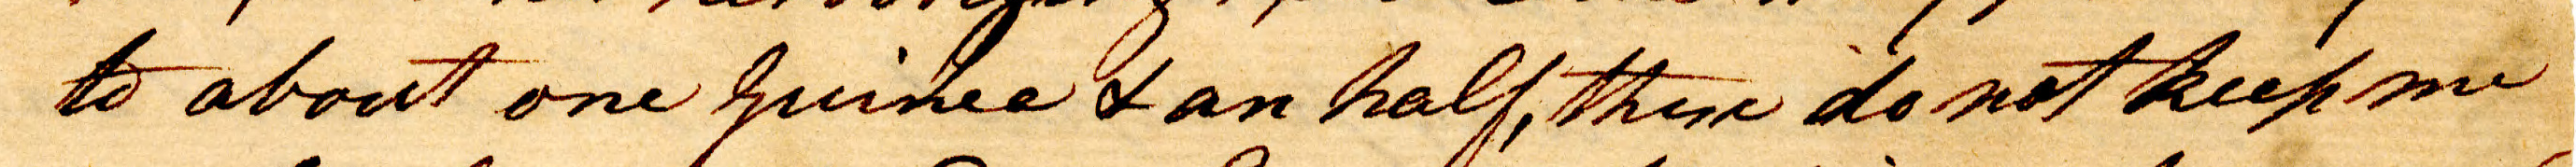to about one Guinea & an half, these do not keep me
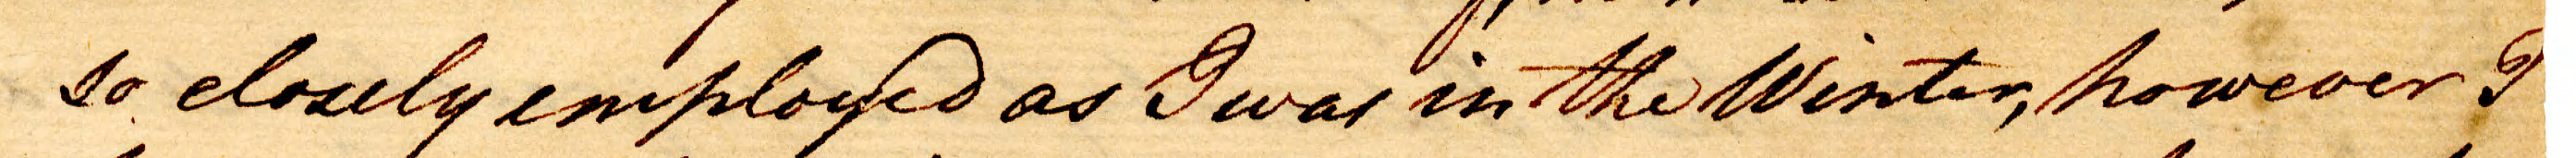so closely employed as I was in the Winter, however I
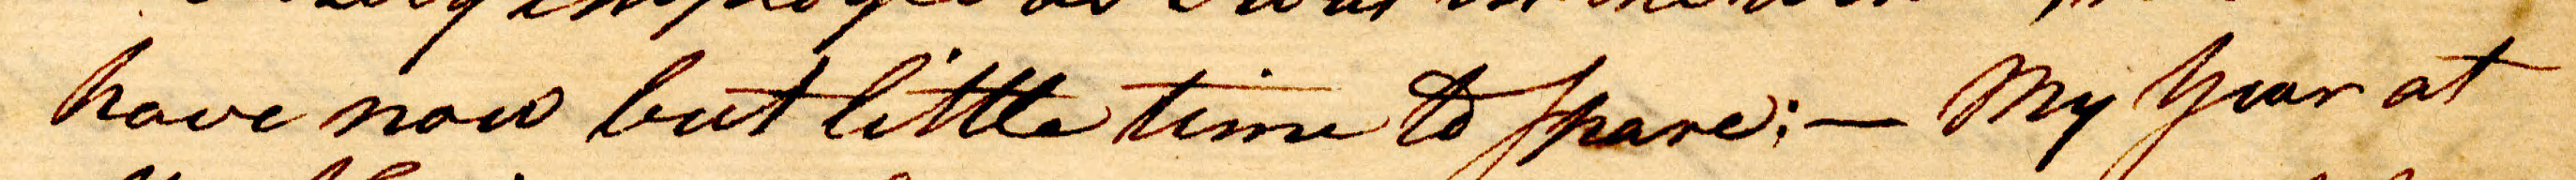have now but little time to spare;- My year at
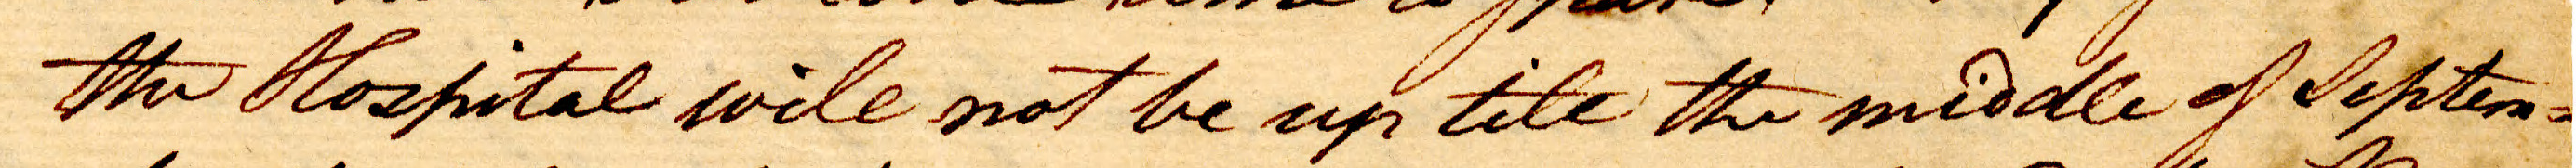the Hospital will not be up till the middle of Septem-
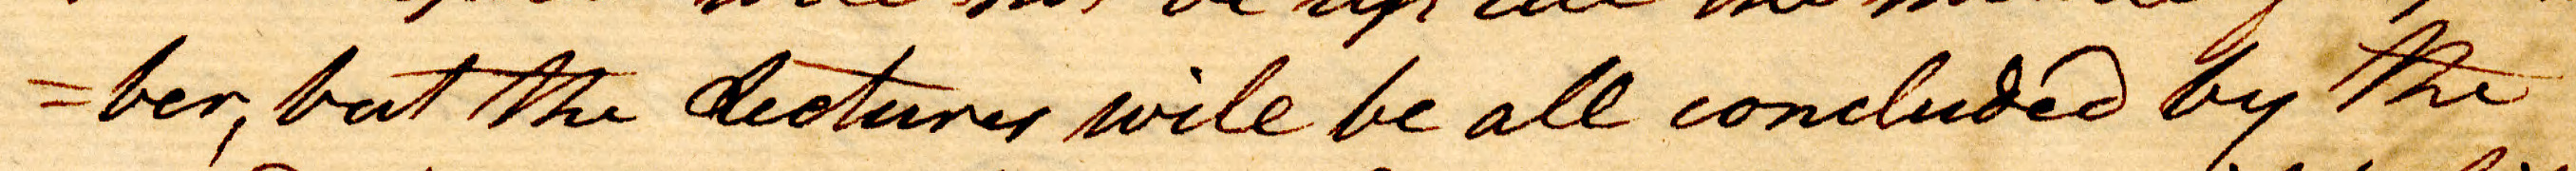-ber, but the Lectures will be all concluded by the
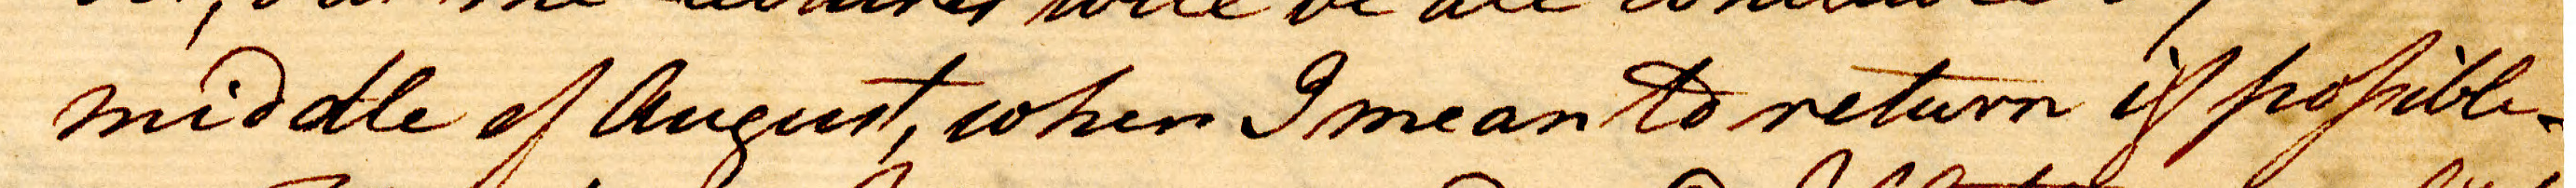middle of August, when I mean to return if possible.
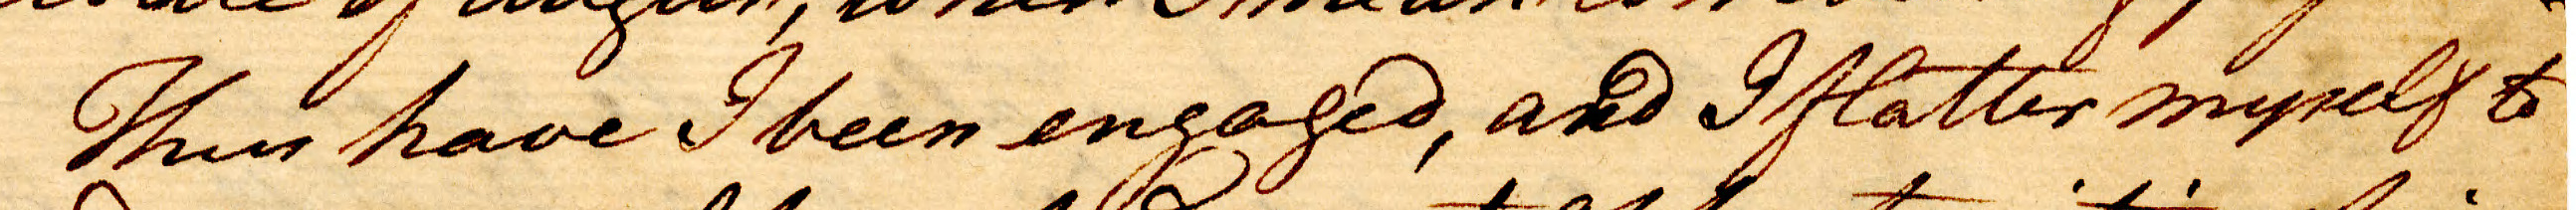Thus have I been engaged, and I flatter myself to
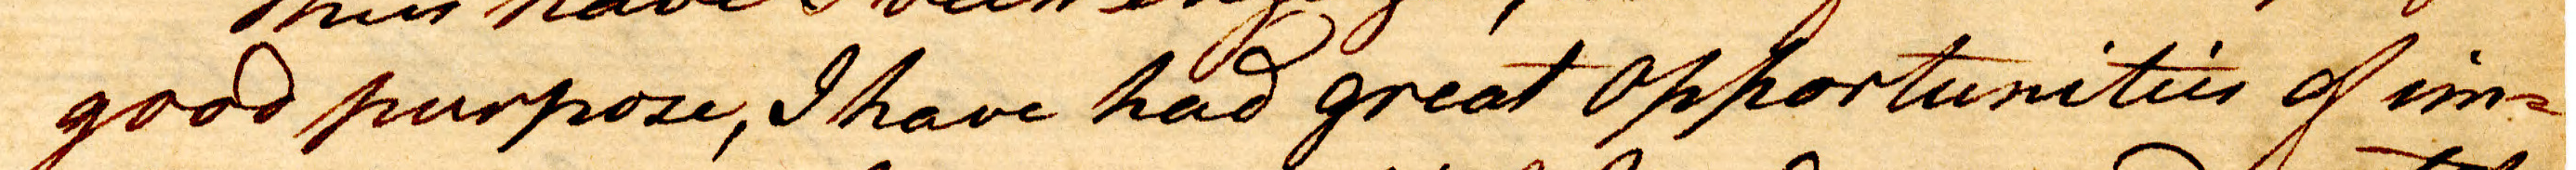good purpose, I have had great opportunities of im-
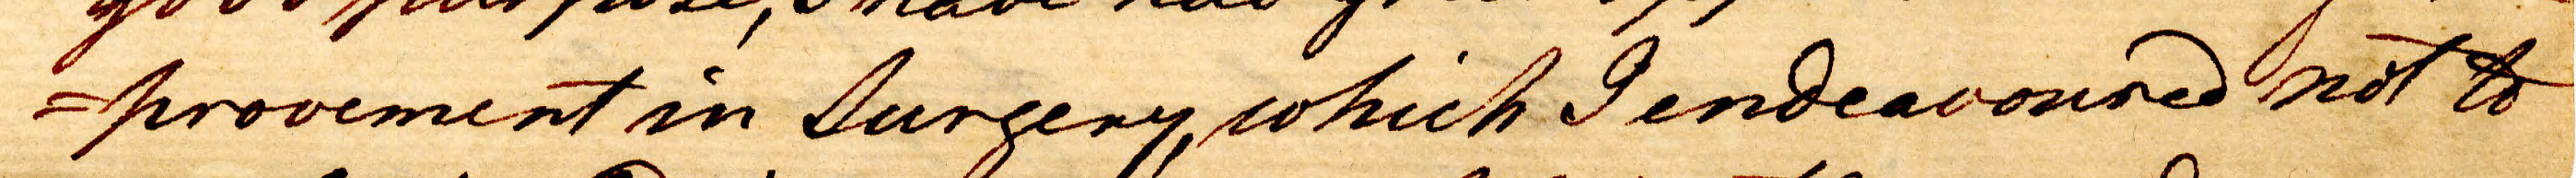-provement in Surgery, which I endeavoured not to
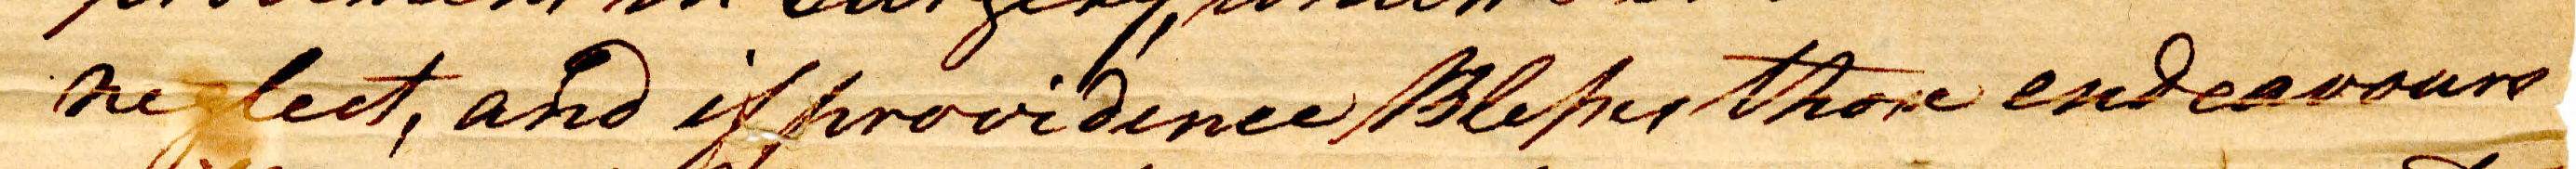neglect, and if providence Blesses those endeavours
